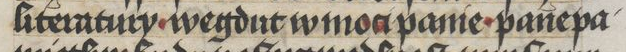literatury.wegdut w moci panie.pane pa¬
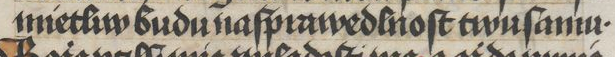mietliw budu naſprawedlnoſt twú ſamu.
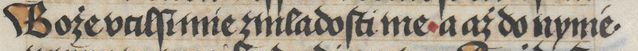Boże vcilſi mie zmladoſti mé.a až do nyníe.
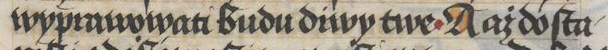wyprawowati budu diwy twe.A aż doſta¬
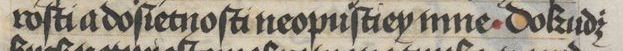roſti a doẛíetnoſti neopuẛtiey mne.Dokudż
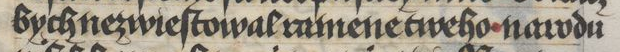bych nezwieſtowal ramene tweho.narodu
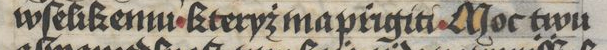wẛelikemu.kteryż ma pṙigiti.Moc twu
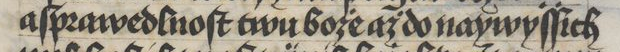a ſprawedlnoſt twu boże aż do naywyẛẛich
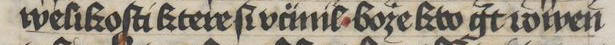welikoſti které ſe vċinil.boże kto ḡt rowen
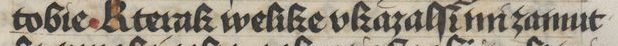tobie.Kterak welike vkazalſi mi zamut¬
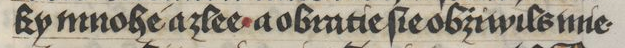ky mnohé a zlee.a obratie ſie obżiwils mie.
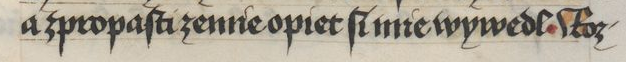a zpropaſti zemie opiet ſí mie wywedl.Roz¬
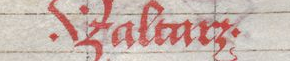.Żaltarz.
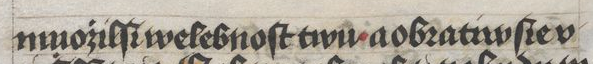munożilſi welebnoſt twu.a obratiwſie v¬
